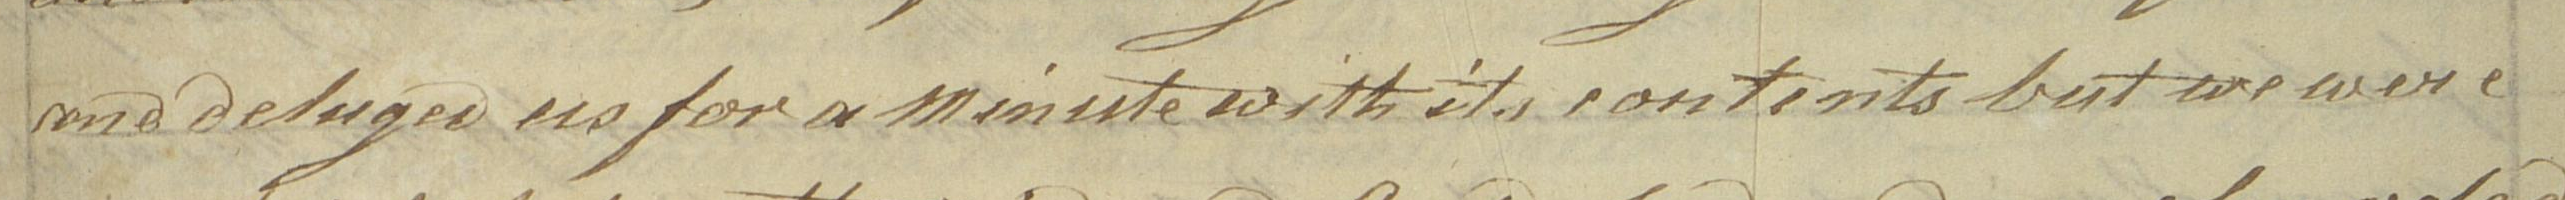and deluged us for a Minute with its contents but we were
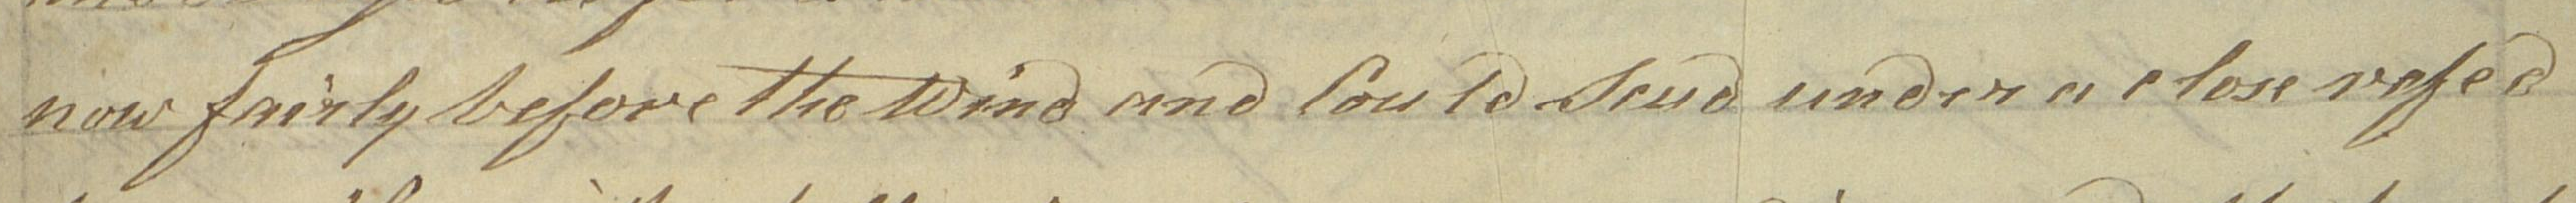now fairly before the wind and Could scud under a close rased
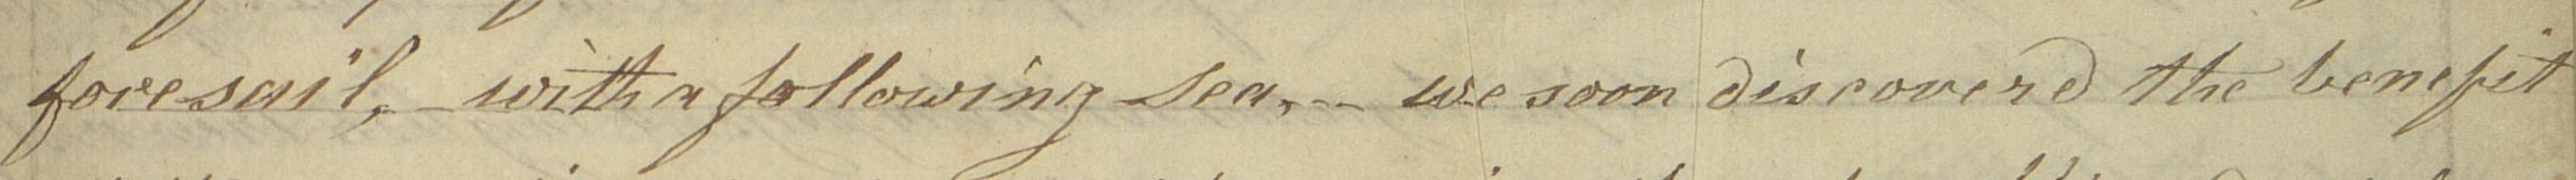foresail, with a following sea, we soon discoverd the benefit
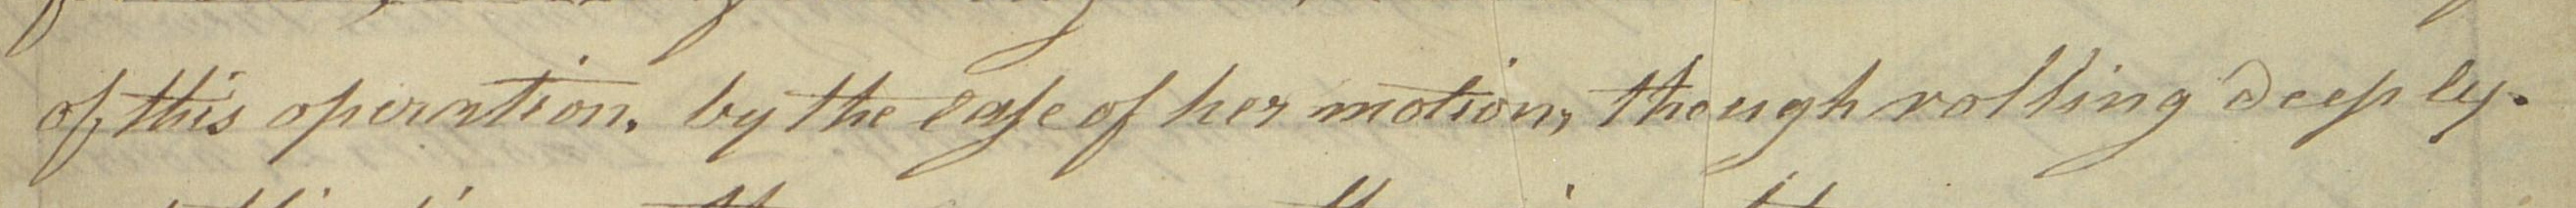of this operation by the Case of her motion, though rolling deeply.
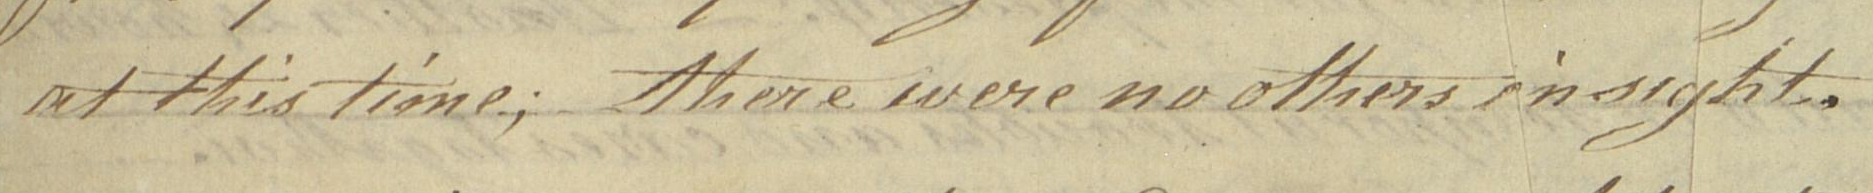at this time; there were no others in sight.
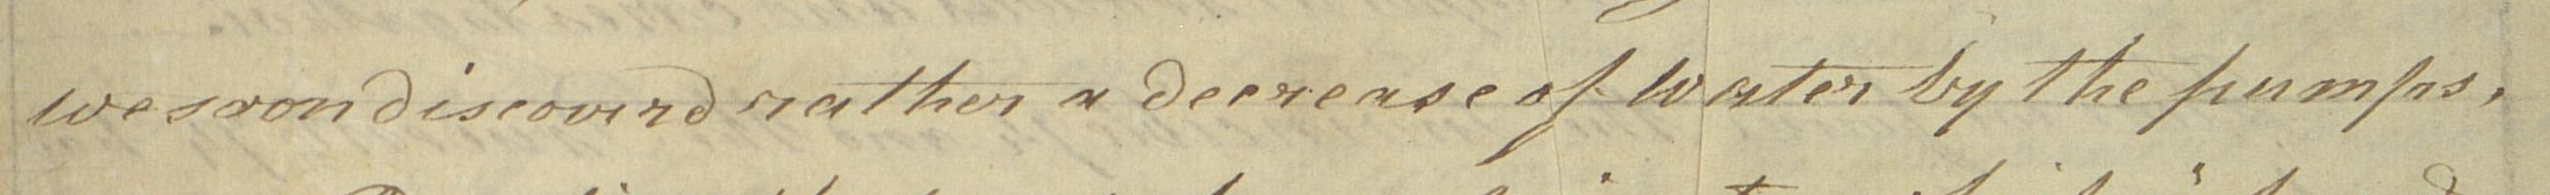we soon discoverd rather a decrease of Water by the pumps,
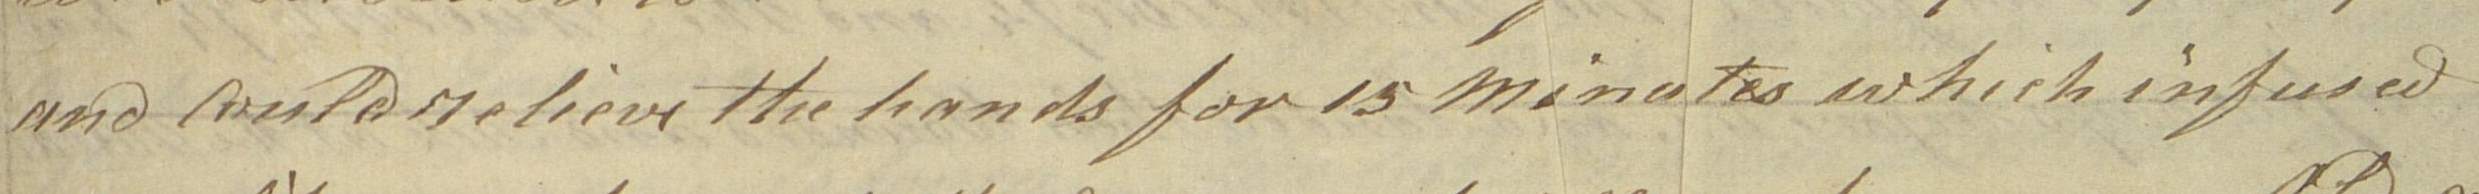and could relieve the hands for 15 minutes which infused
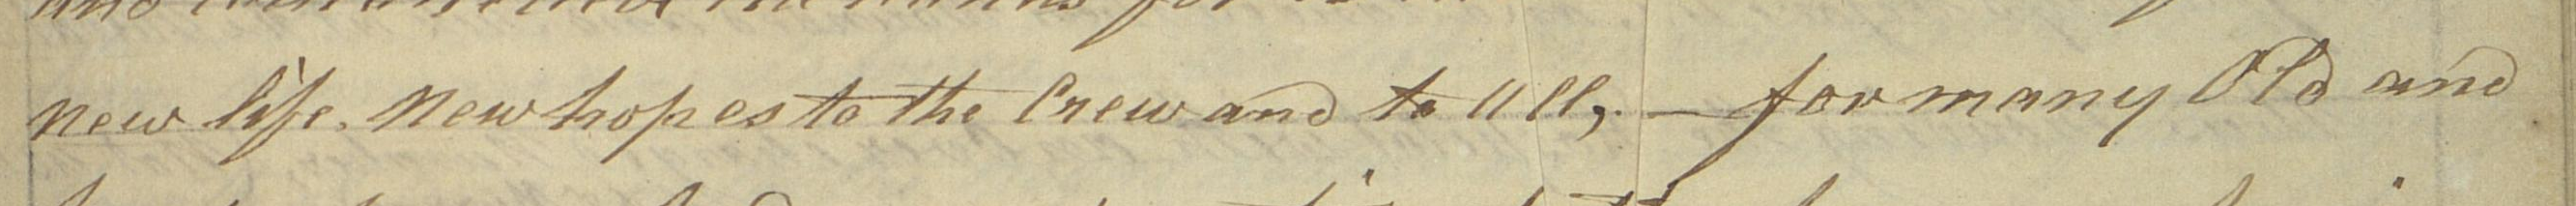new life. New hopes to the Crew and to all, for many old and
